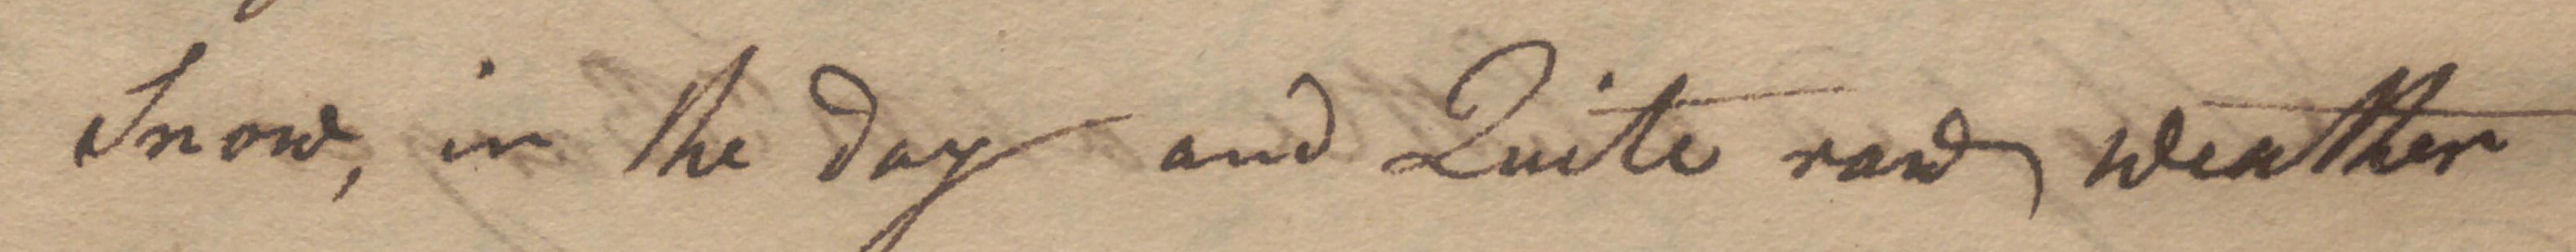Snow, in the day and Quite raw Weather
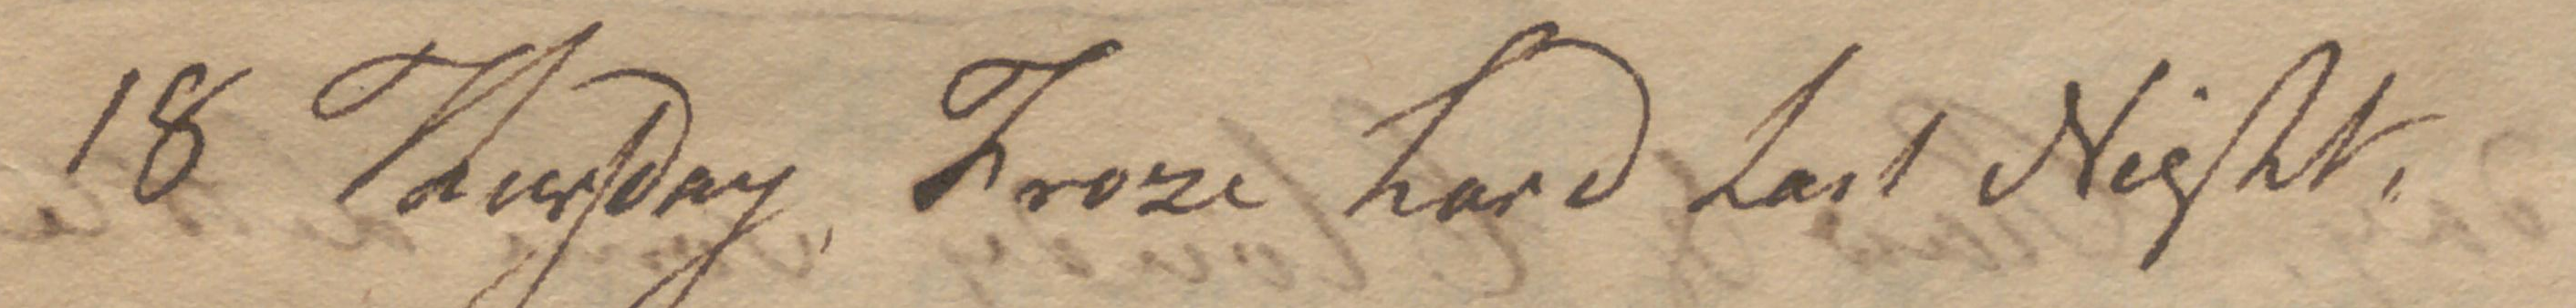18 Thursday Froze hard last Night,
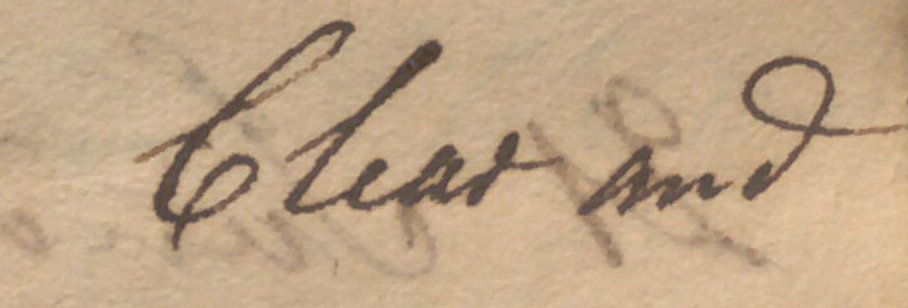Clear and
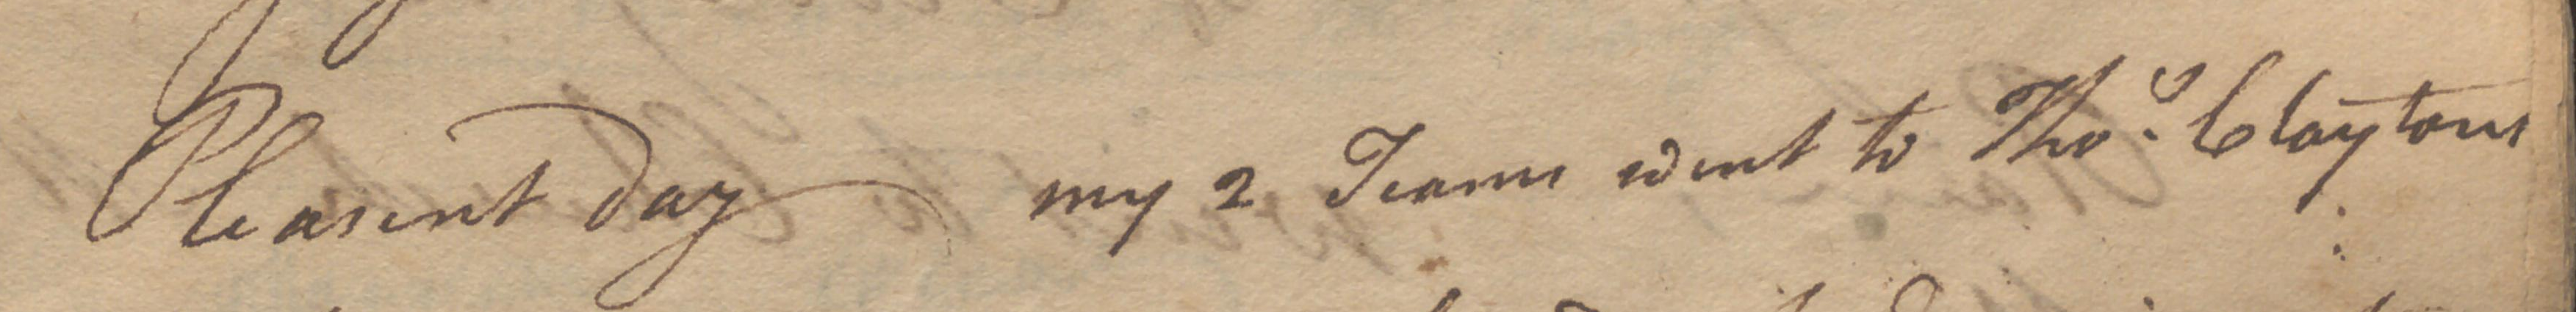Pleasent day my 2 Teams went to Tho^s. Claytons
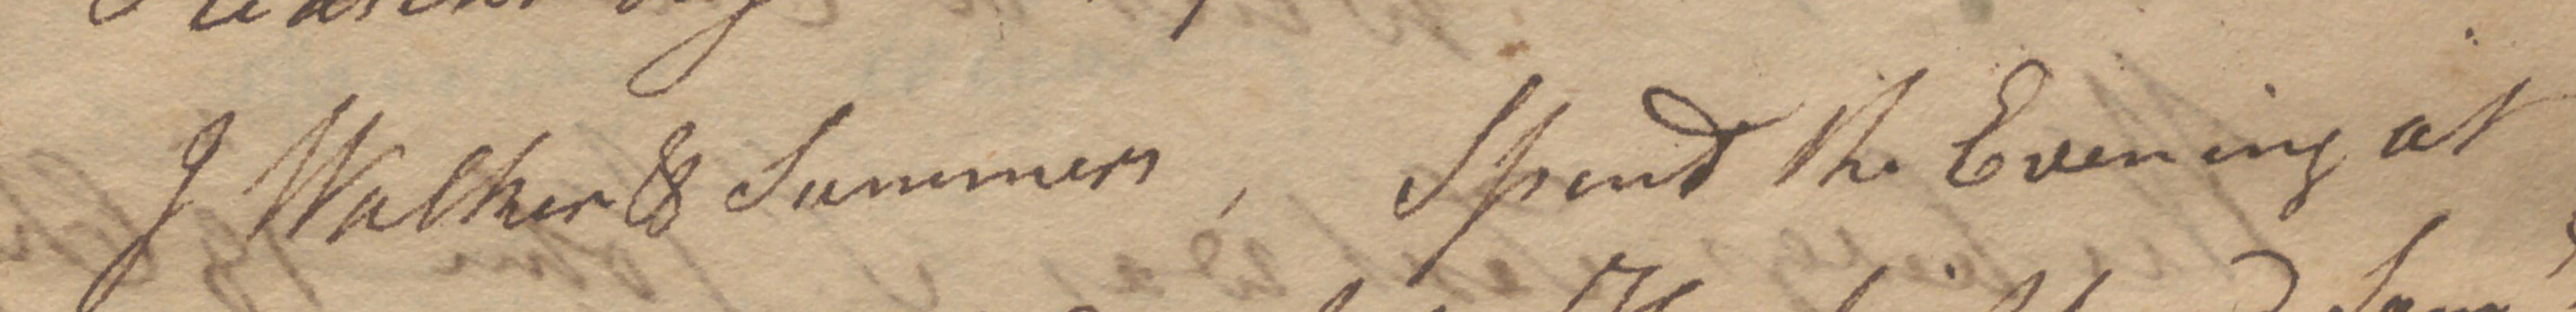J Walker & Summers, Spent the Evening at
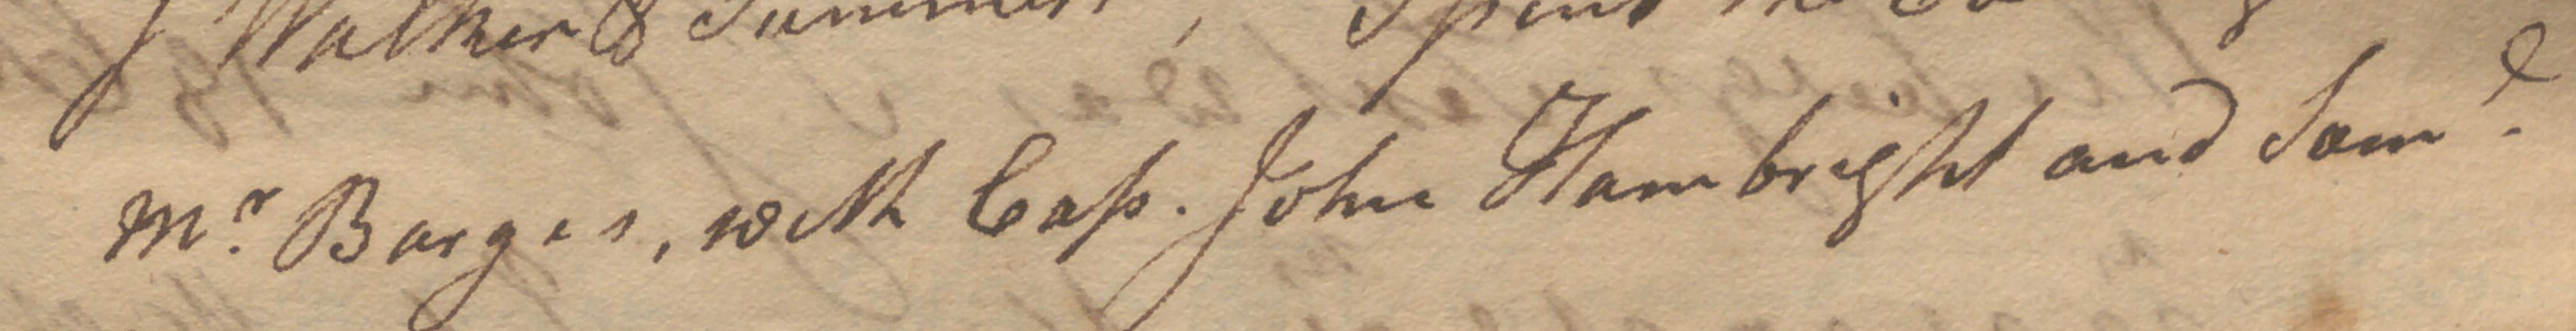M^r. Barges, with Cap. John Ham bright and Sam^l.
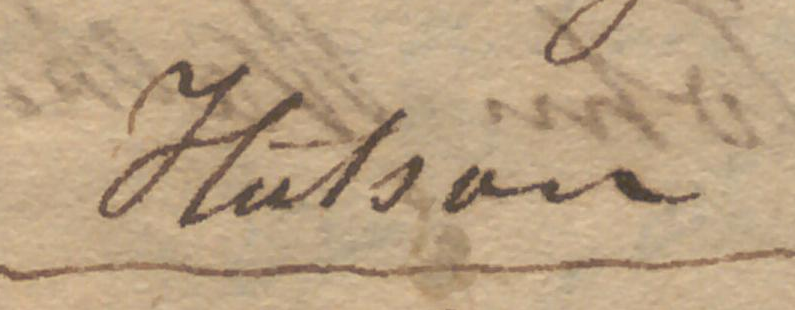Hutson
